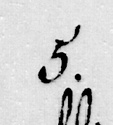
5.
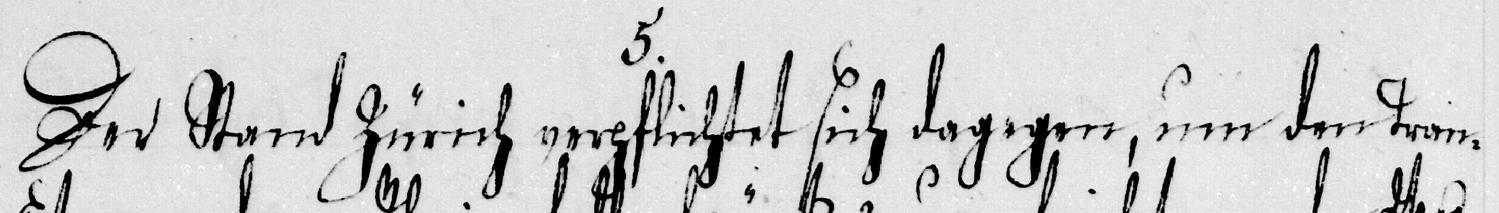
Der Stand Zürich verpflichtet sich dagegen, um den Tran¬
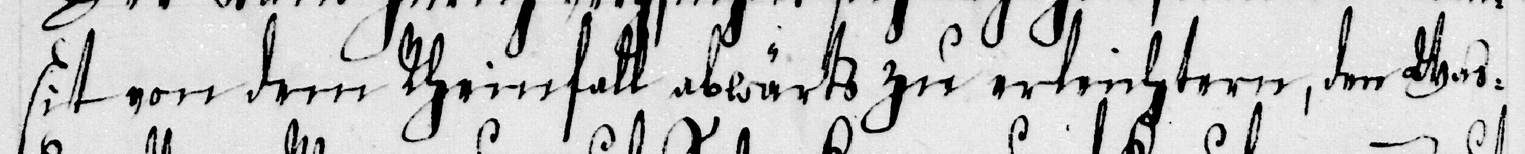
sit von dem Rheinfall abwärts zu erleichtern, den Waß¬
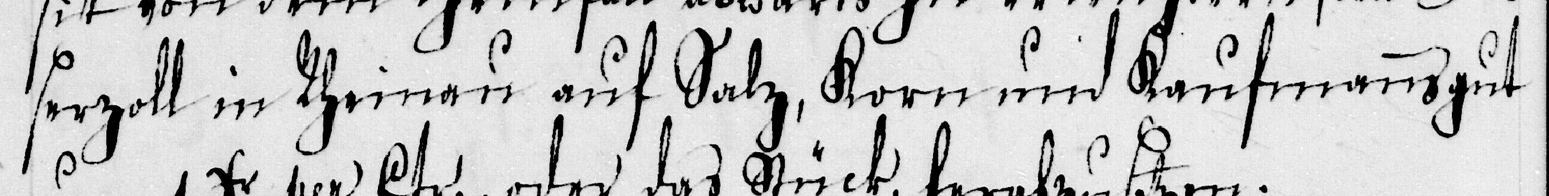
erzoll in Rheinau auf Salz, Korn und Kaufmannsgut
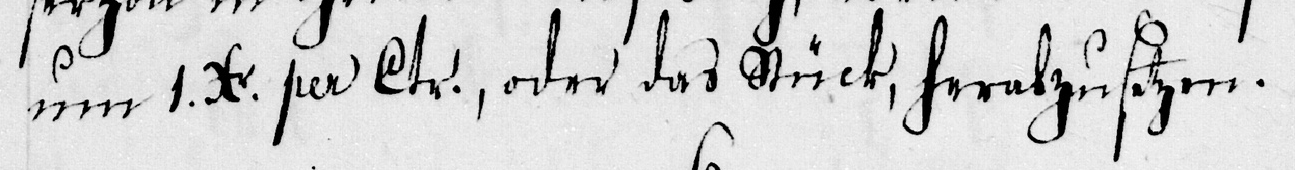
um 1. Xr. per Ctr., oder das Stück, herabzusetzen.
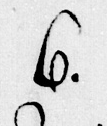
6.
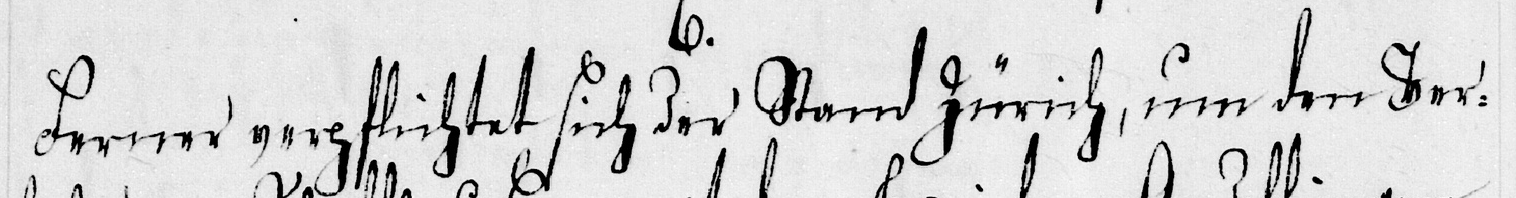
Ferner verpflichtet sich der Stand Zürich, um den Ver¬
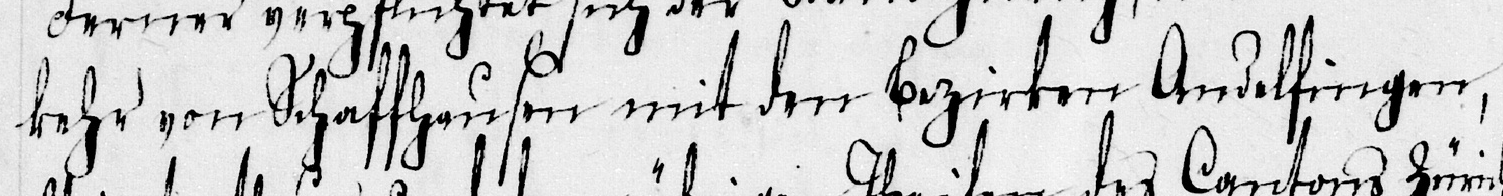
kehr von Schaffhausen mit den Bezirken Andelfingen,
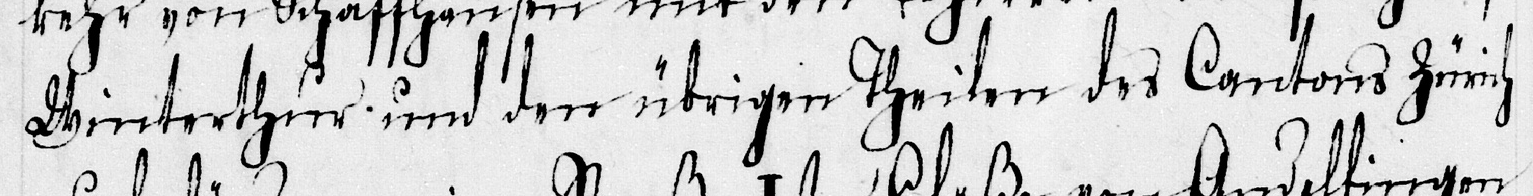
Winterthur und den übrigen Theilen des Cantons Zürich
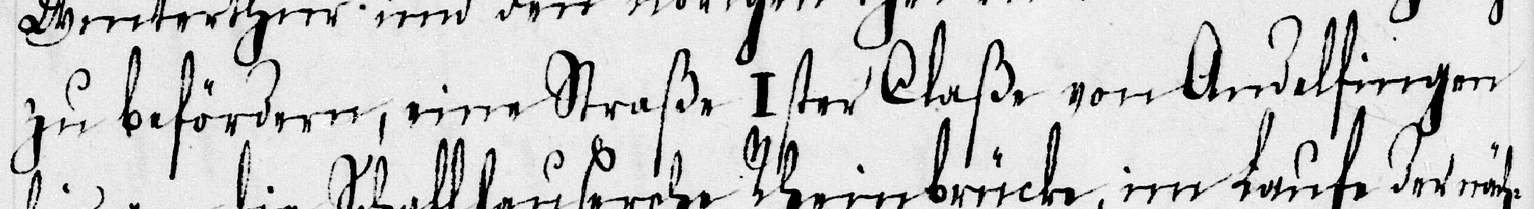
zu befördern, eine Straße Ister Claße von Andelfingen
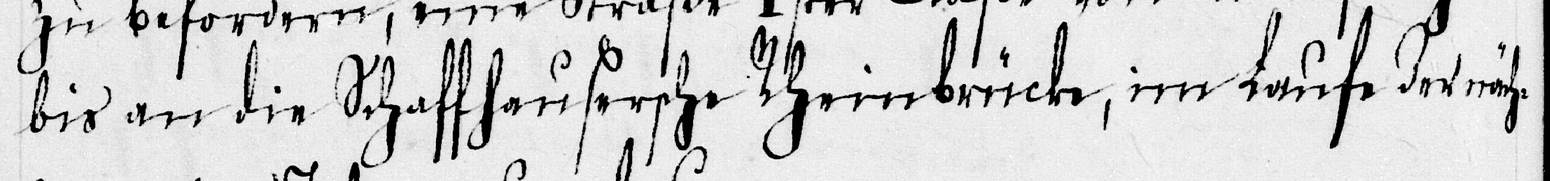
bis an die Schaffhausersche Rheinbrücke, im Laufe der näc¬
